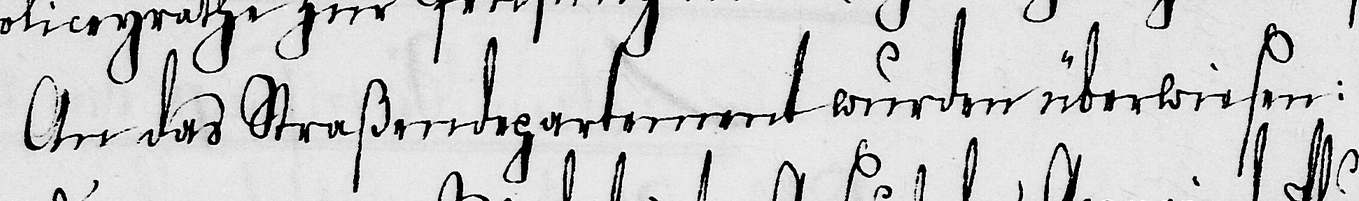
an das Straßendepartement wurden überwiesen:
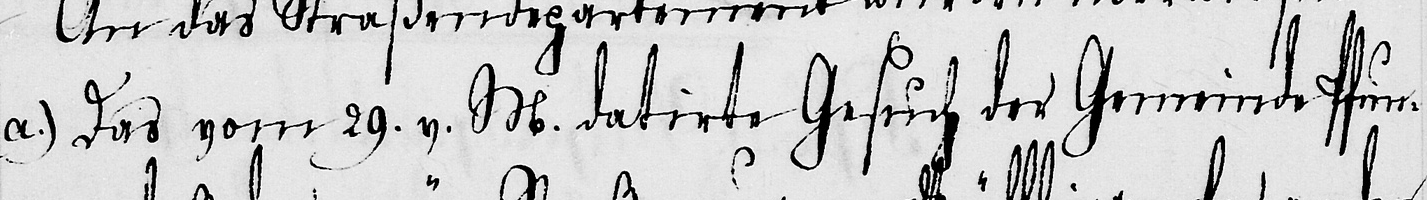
a.) Das vom 29. v. M. datirte Gesuch der Gemeinde Pfun¬
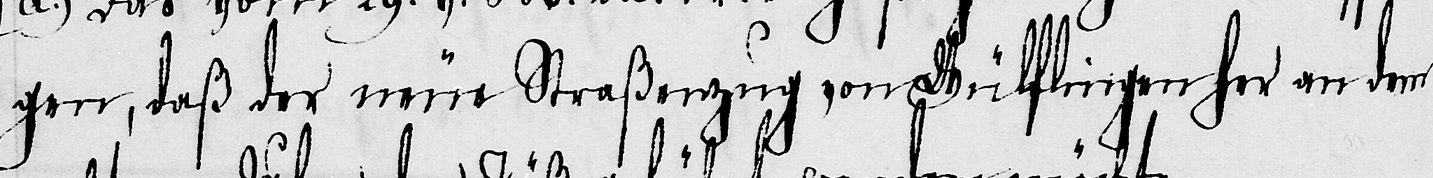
gen, daß der neue Straßenzug von Wülflingen her an dem
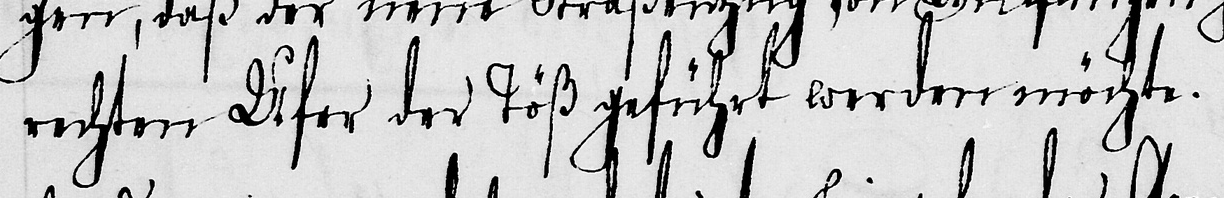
rechten Ufer der Töß geführt werden möchte.
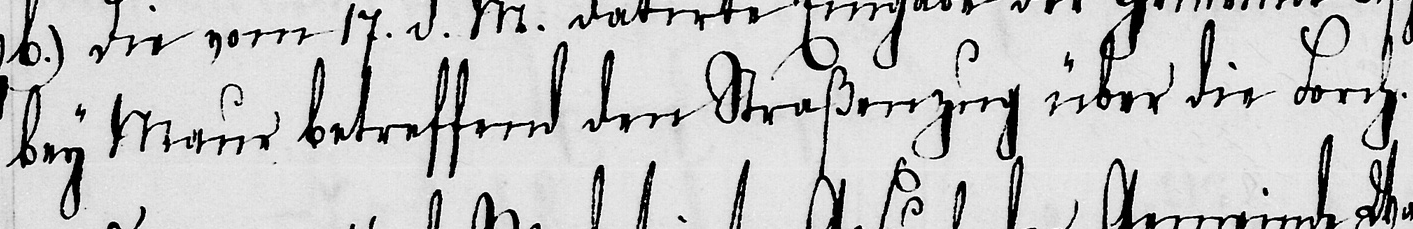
bey Maur betreffend den Straßenzug über die Forch.
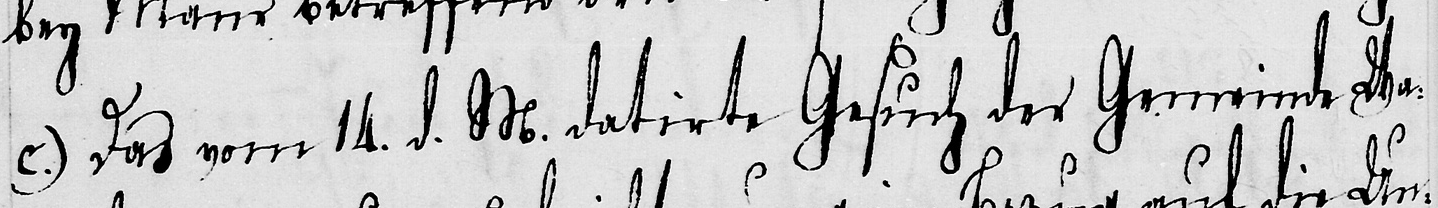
c.) Das vom 14. d. M. datirte Gesuch der Gemeinde Was¬
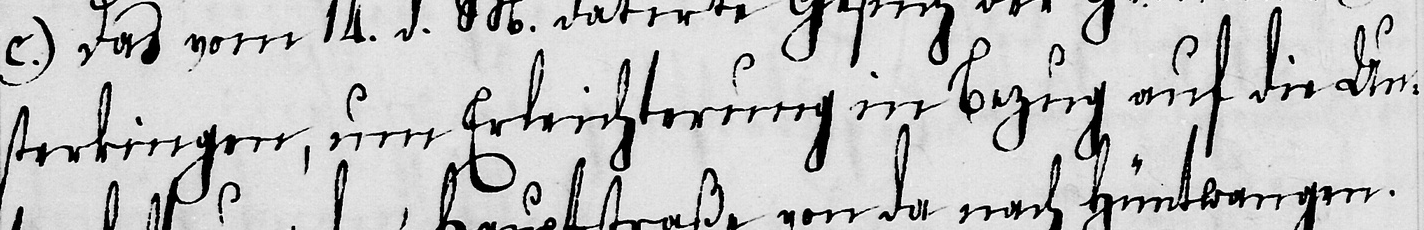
terkingen, um Erleichterung in Bezug auf die Un¬
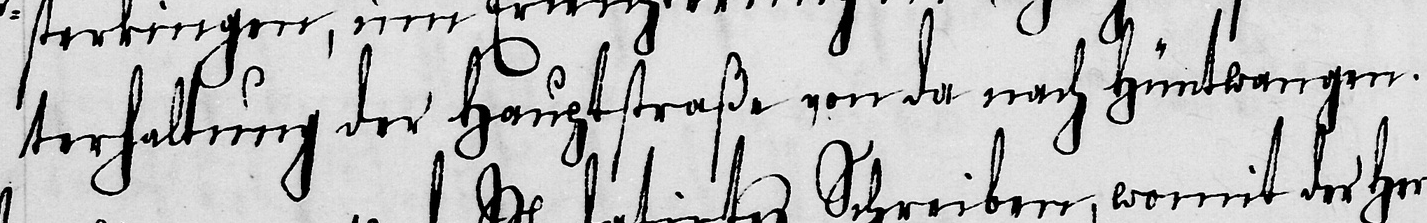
terhaltung der Hauptstraße von da nach Hüntwangen.
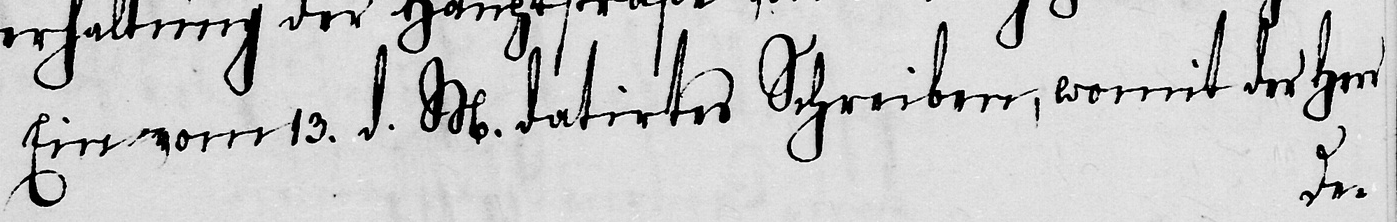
Ein vom 13. d. M. datirtes Schreiben, womit der Her¬
